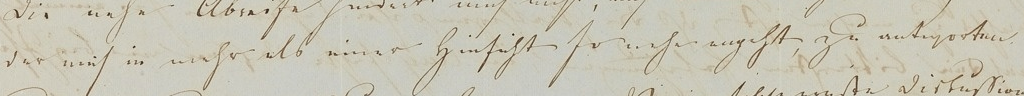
der mich in mehr als einer Hinsicht so nahe angeht, zu antworten.
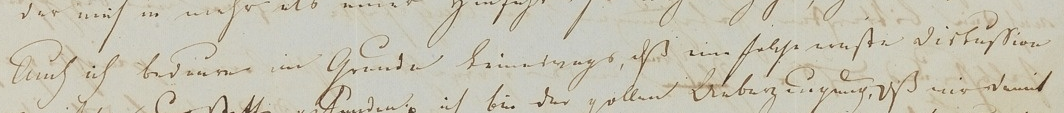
Auch ich bedaure im Grunde keineswegs, dß eine solche ernste Diskußion
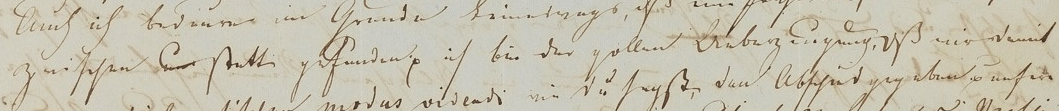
zwischen uns statt gefunden & ich bin der vollen Ueberzeugung, dß wir damit
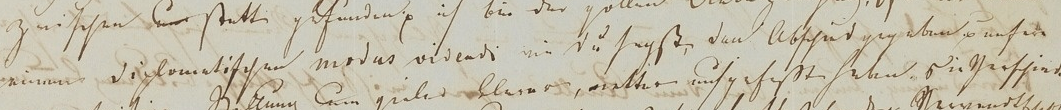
einem diplomatischen modus vivendi wie du sagst, den Abschied gegeben & unsere
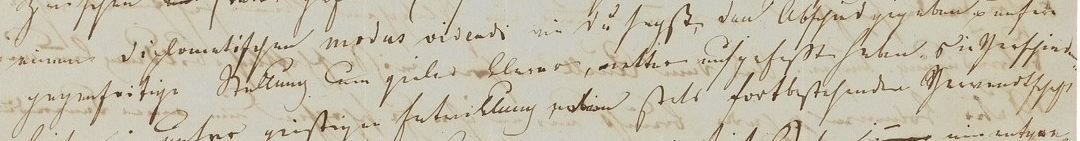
gegenseitige Stellung um vieles klarer, netter aufgefaßt haben. Die Verschieden-
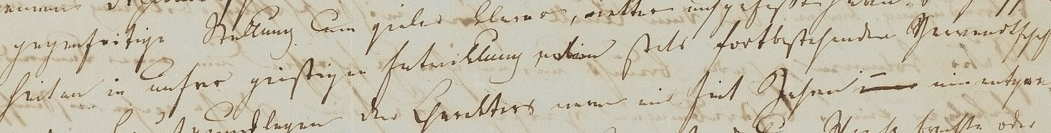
heiten in unsrer geistigen Entwicklung neben stets fortbestehender Verwandtschaft
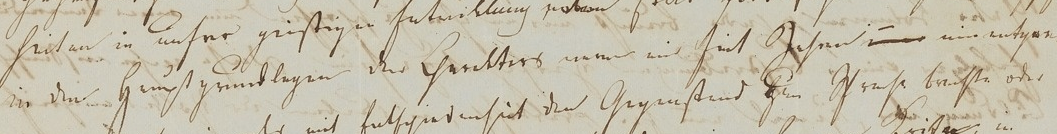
in den Hauptgrundlagen des Charakters waren mir seit Jahren immer nie entgan-
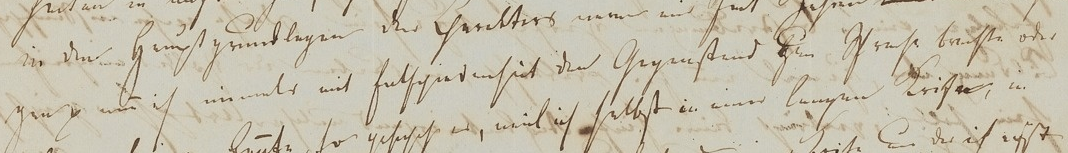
gen & wenn ich niemals mit Entschiedenheit den Gegenstand zur Sprache brachte oder
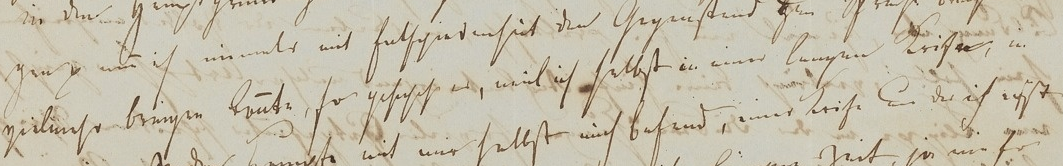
vielmehr bringen konnte, so geschah es, weil ich selbst in einer langen
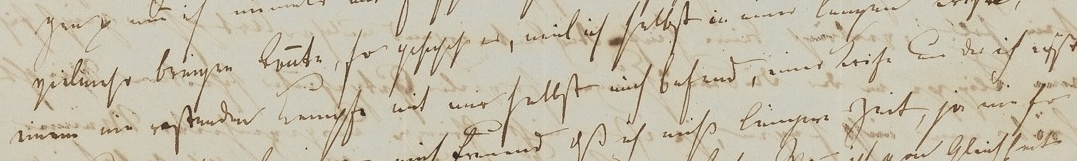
einem nie rastenden Kampfe mit mir selbst mich befand, einer Krise aus der ich erst
